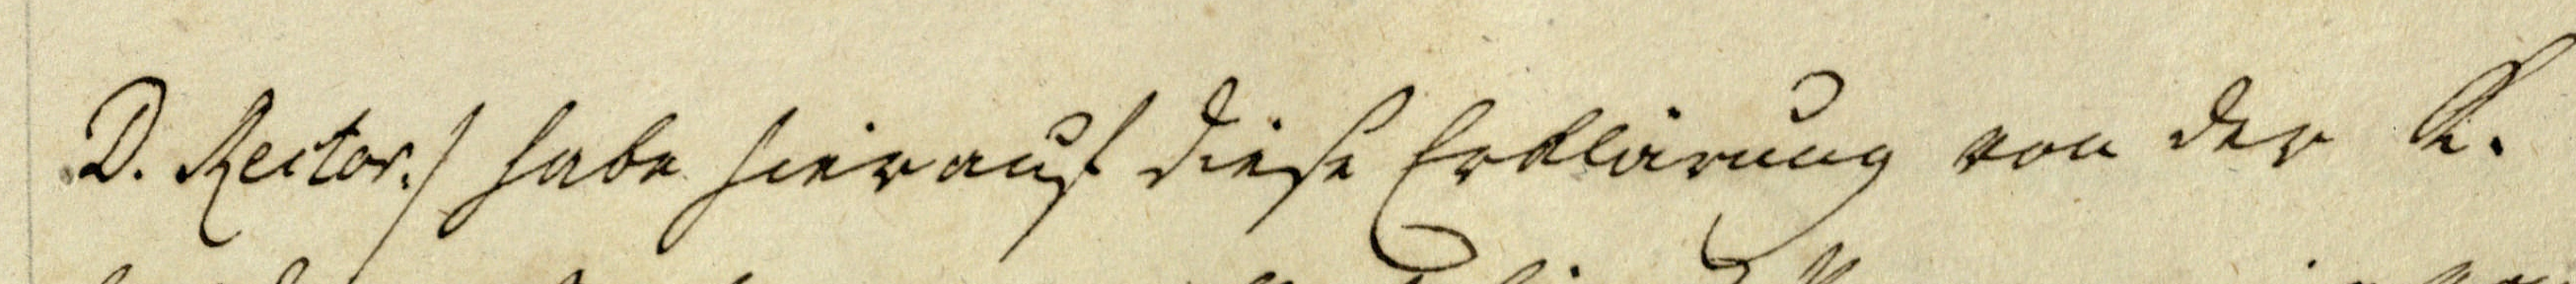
D. Rector :/ habe hierauf diese Erklärung von der K.
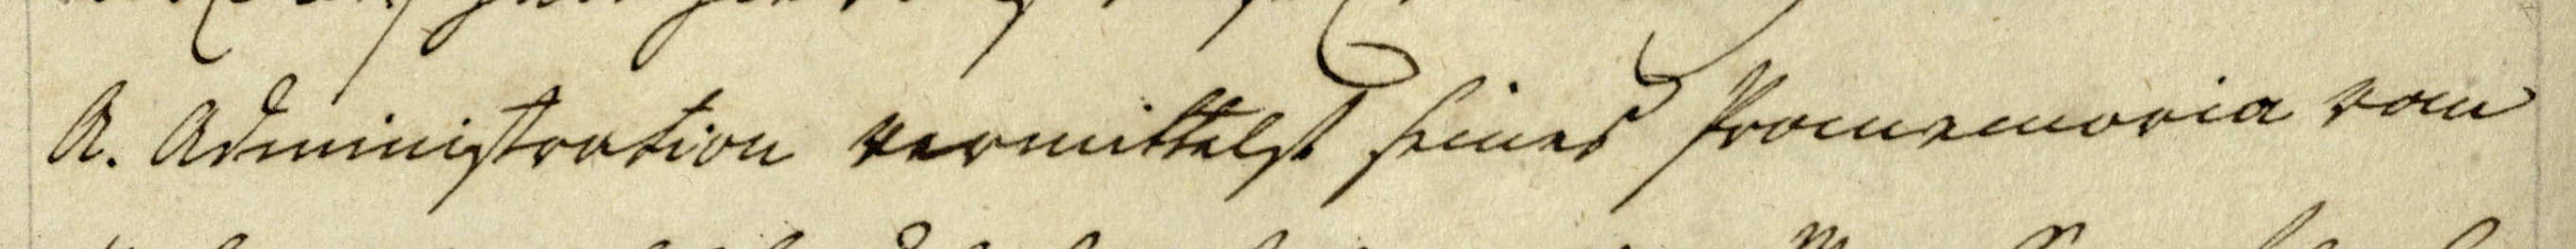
A. Administration vermittelst seines Promemoria vom
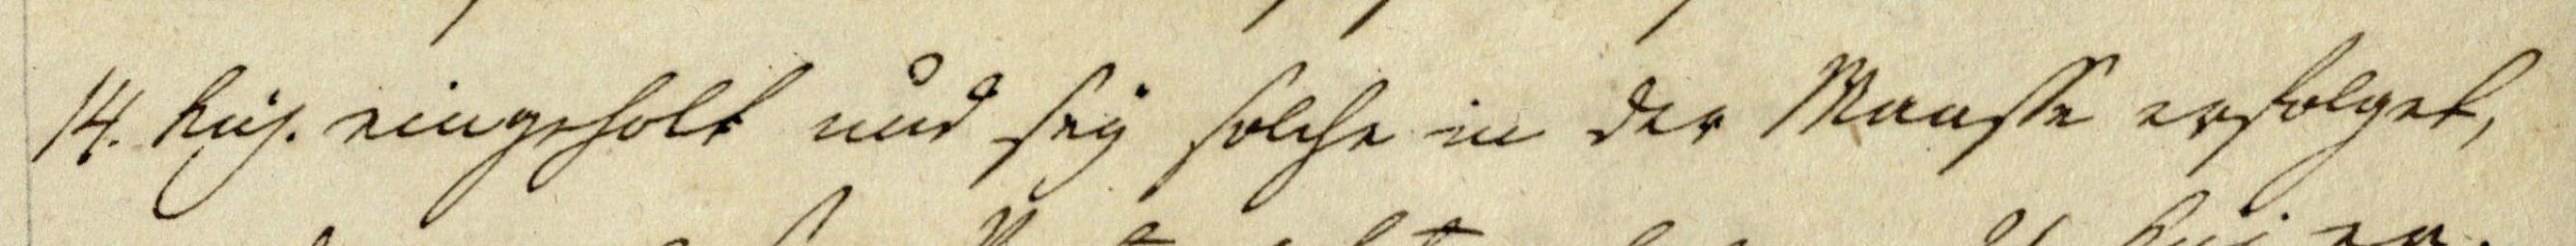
14. huj. eingeholt und seÿ solche in der Maasse erfolget,
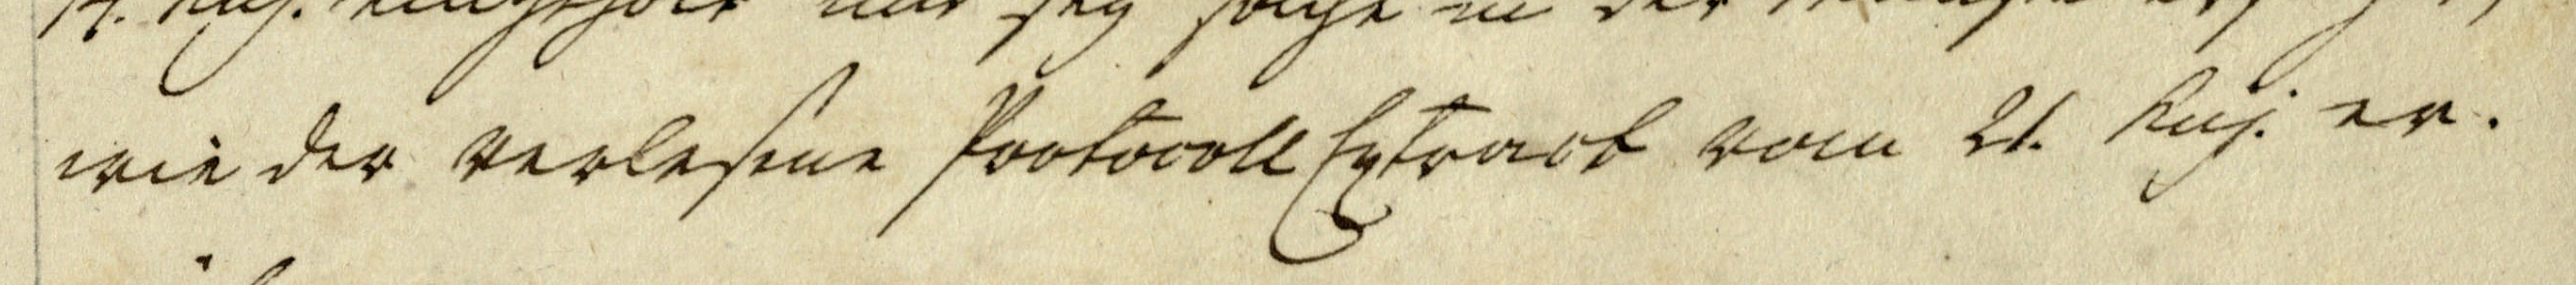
wie der verlesene Protocoll Extract vom 21. huj. er¬
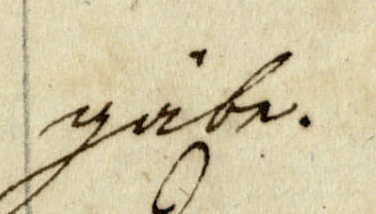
gäbe.
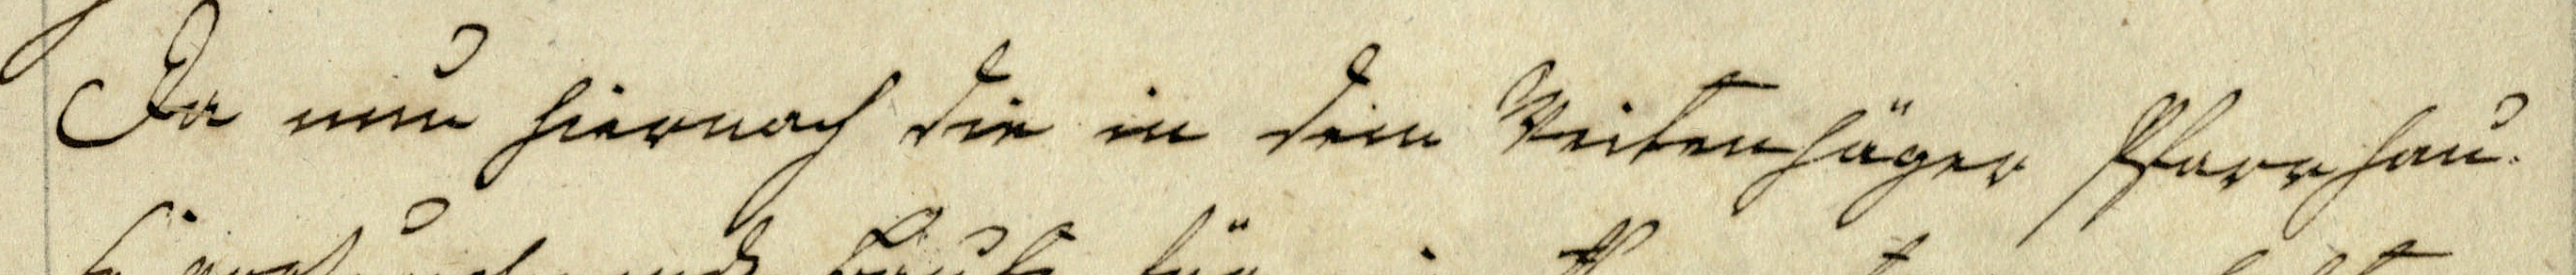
Da nun hiernach die in dem Weitenhäger Pfarrhau¬
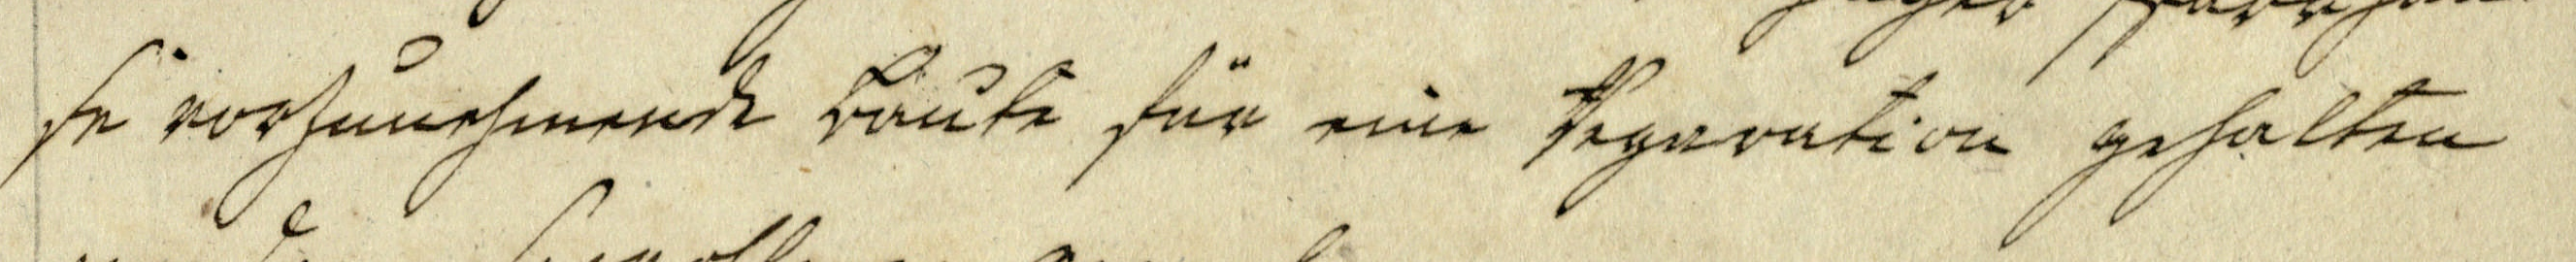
se vorzunehmende Baute für eine Reparation gehalten
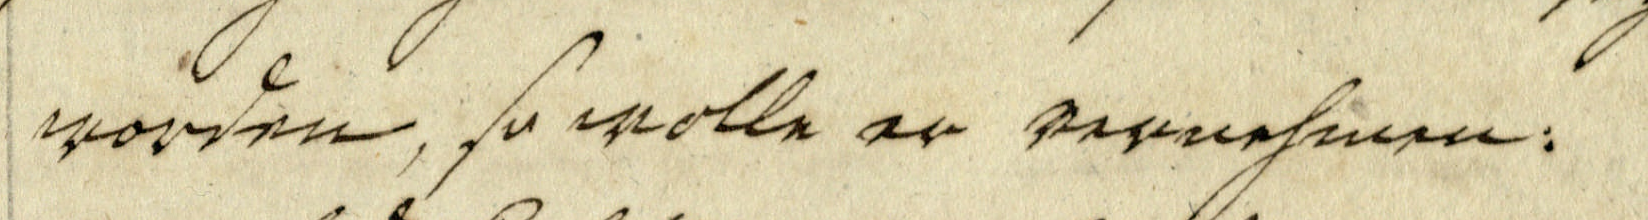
worden, so wolle er vernehmen:
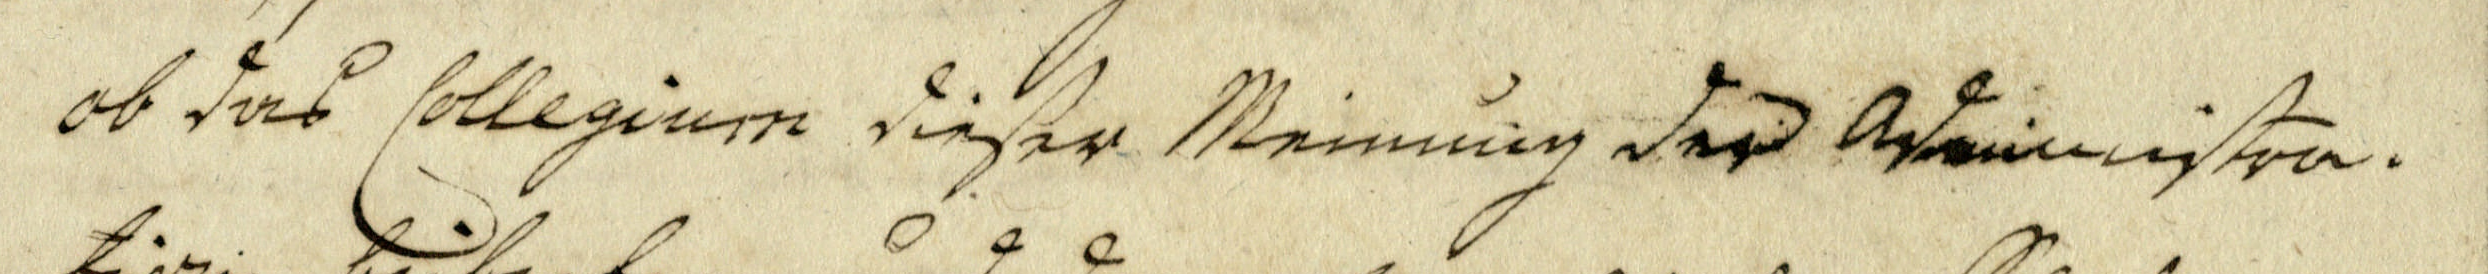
ob das Collegium dieser Meinung der Administra¬
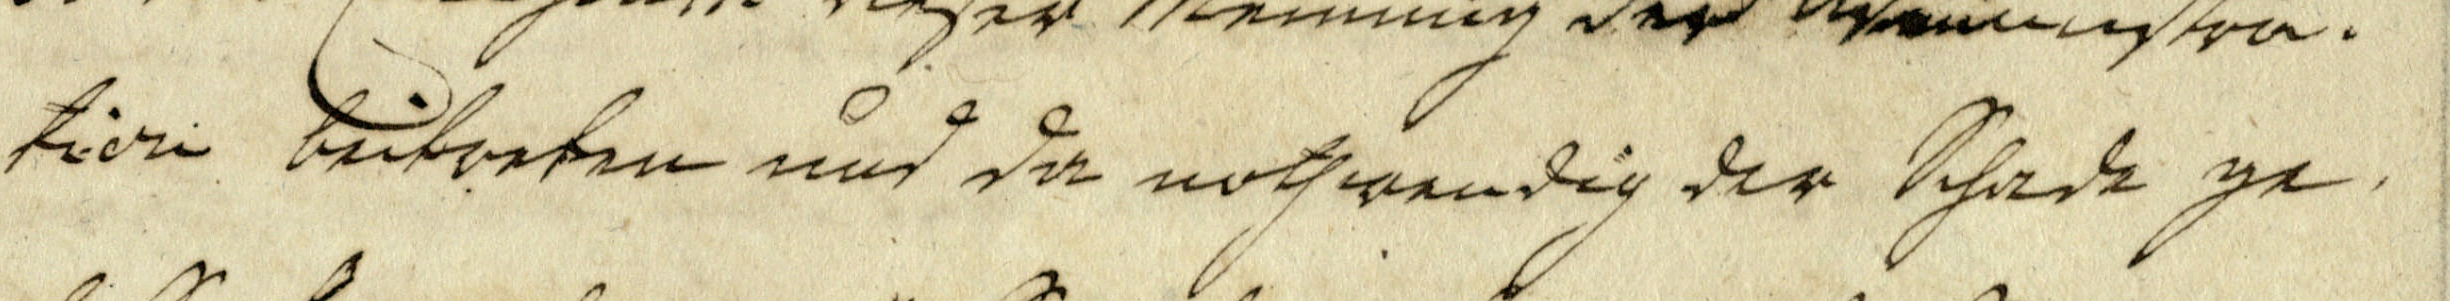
tion beitreten und da nothwendig der Schade ge¬
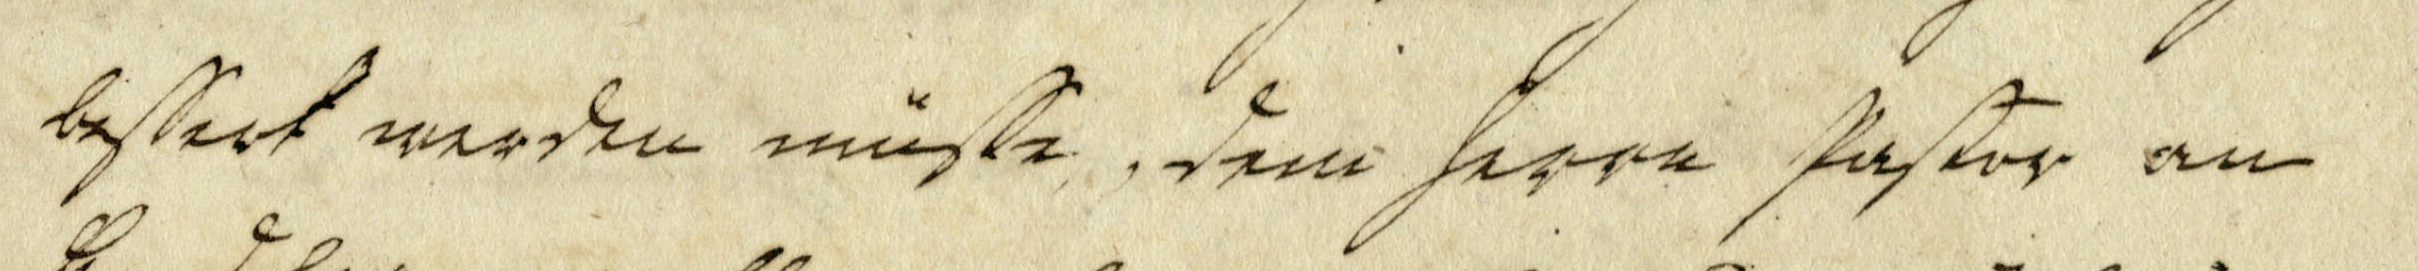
bessert werden müsse, dem Herrn Pastor an
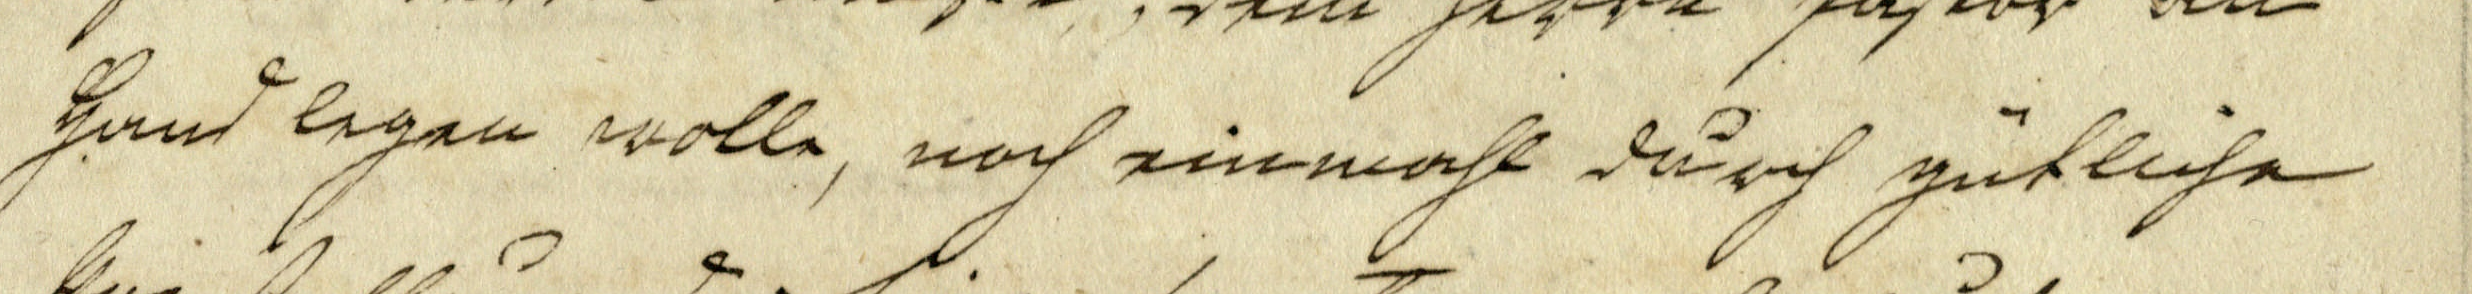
Hand legen wolle, noch einmahl durch gütliche
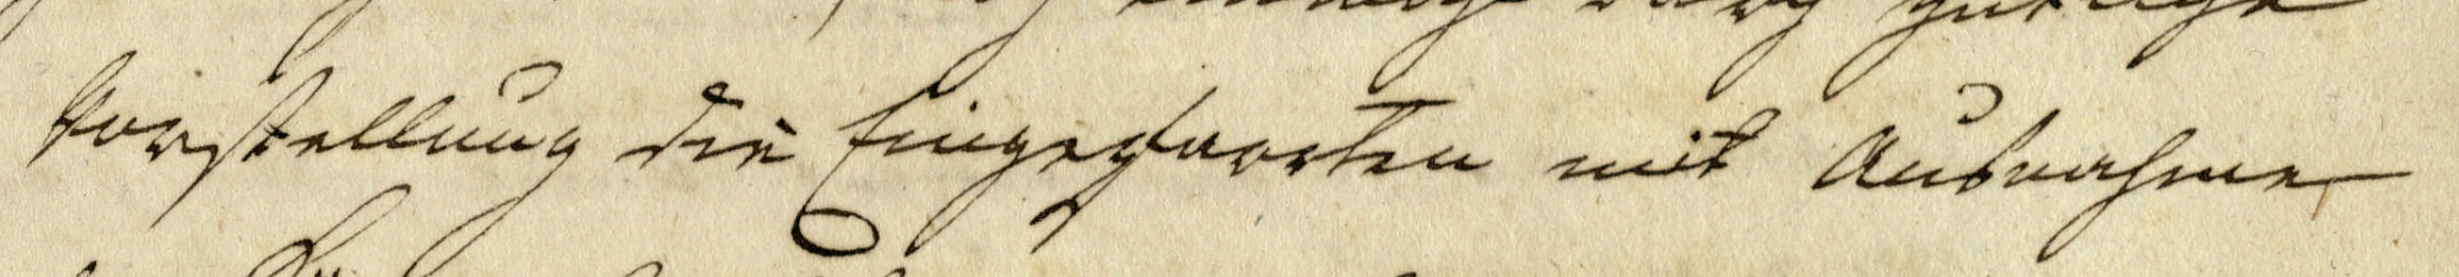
Vorstellung die Eingepfarrten mit Ausnahme
